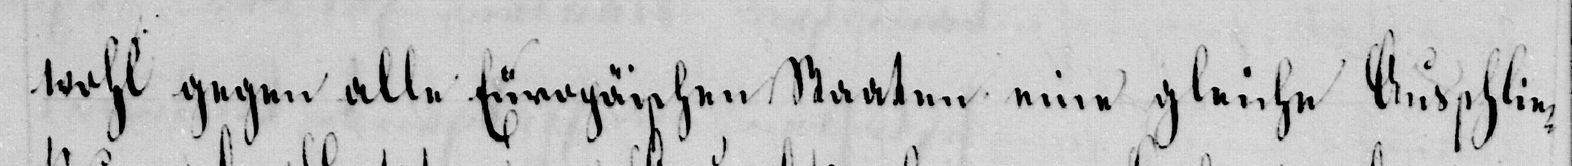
wohl gegen alle Europäischen Staaten eine gleiche Ausschlie¬
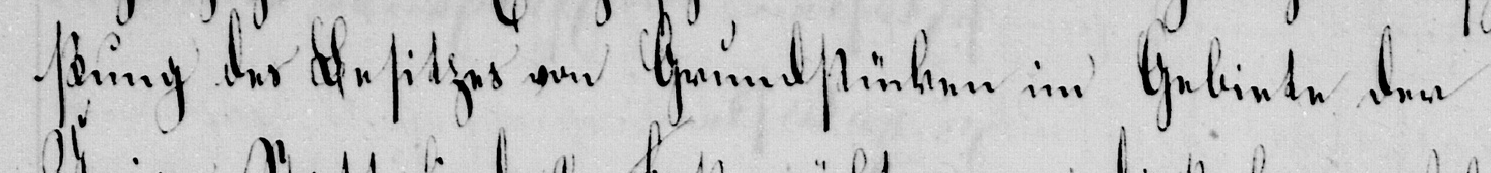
ßung des Besitzes von Grundstücken im Gebiete der
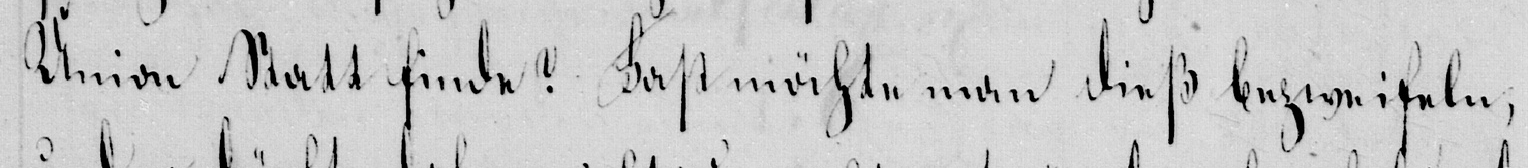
Union Statt finde? Fast möchte man dieß bezweifeln,
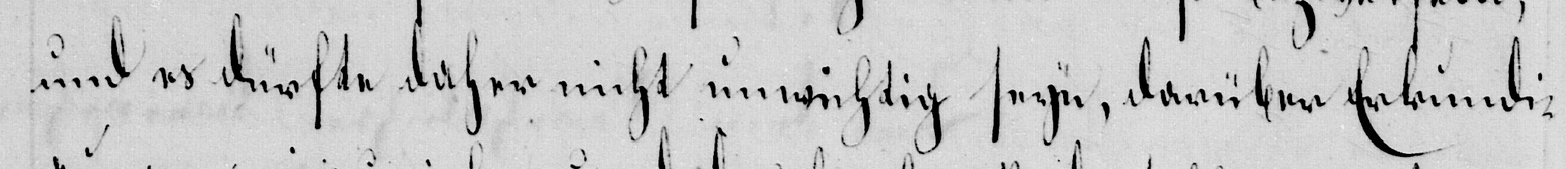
und es dürfte daher nicht unwichtig seyn, darüber Erkundi¬
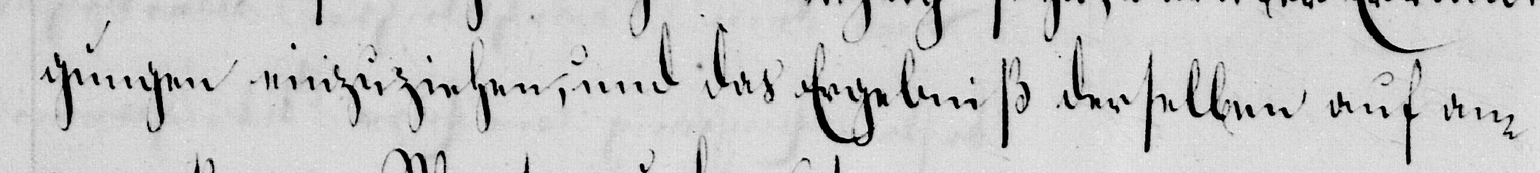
gungen einzuziehen, und das Ergebniß derselben auf an¬
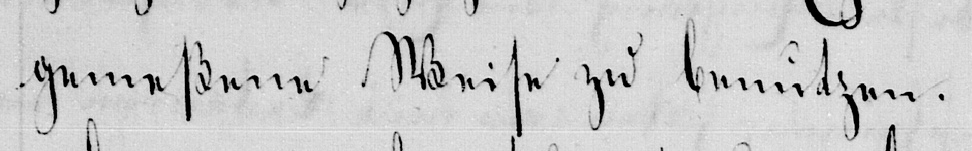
gemeßene Weise zu benutzen.
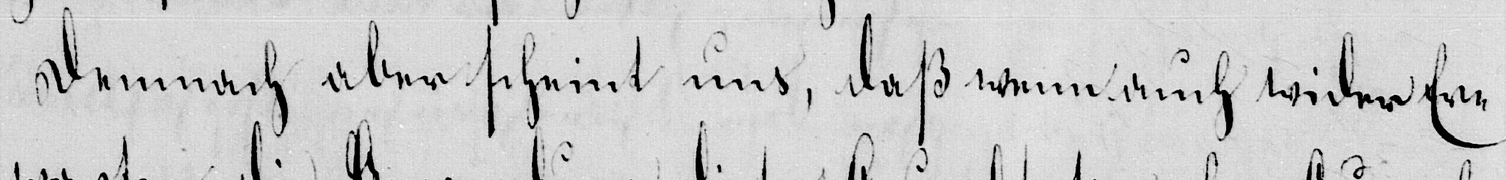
Demnach aber scheint uns, daß wenn auch wider Er¬
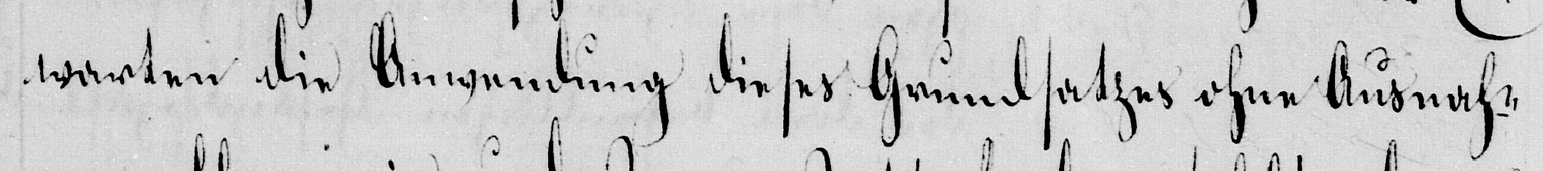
warten die Anwendung dieses Grundsatzes ohne Ausnah¬
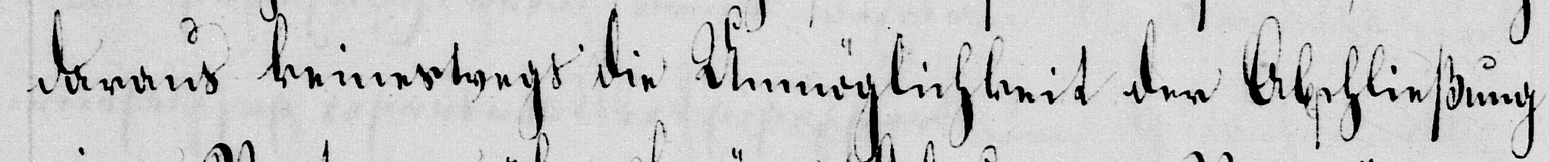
daraus keineswegs die Unmöglichkeit der Abschließung
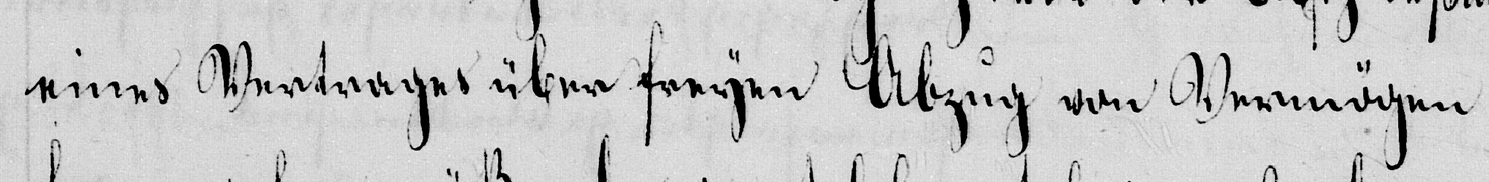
eines Vertrages über freyen Abzug von Vermögen
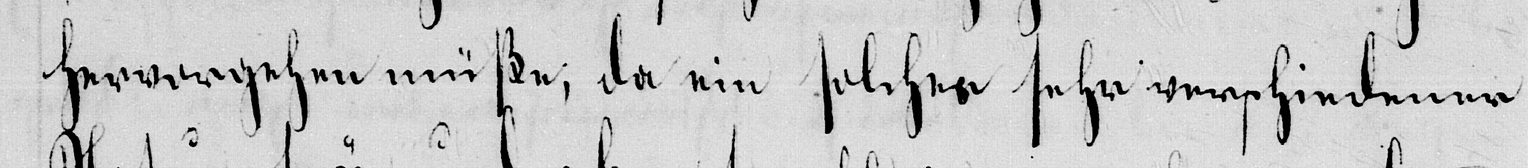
hervorgehen müße, da ein solcher sehr verschiedener
